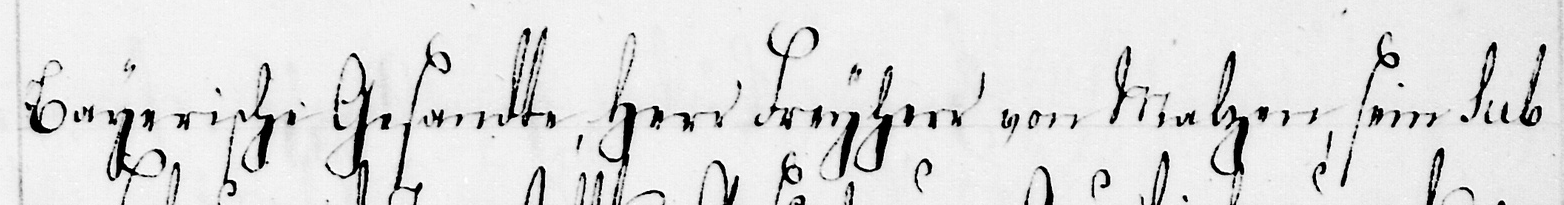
Bayerische Gesandte, Herr Freyherr von Malzen, sein sub
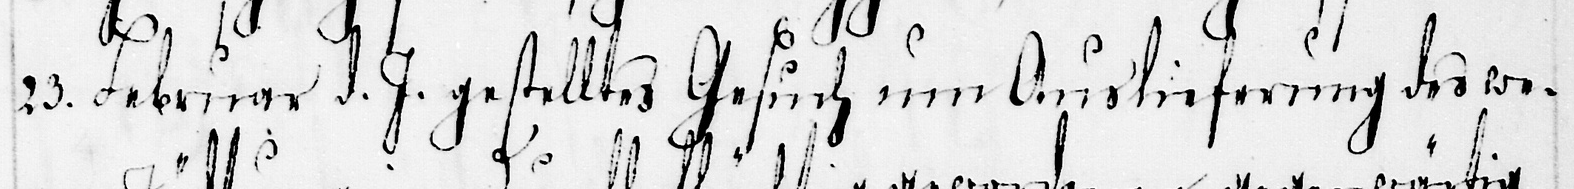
23. Februar d. J. gestelltes Gesuch um Auslieferung des we¬
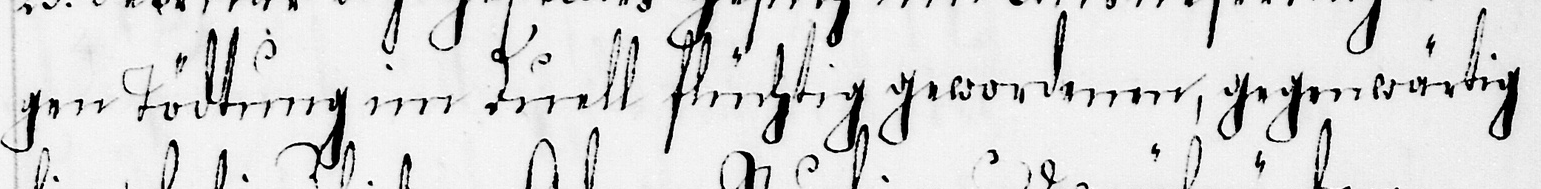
gen Tödtung im Duell flüchtig gewordenen, gegenwärtig
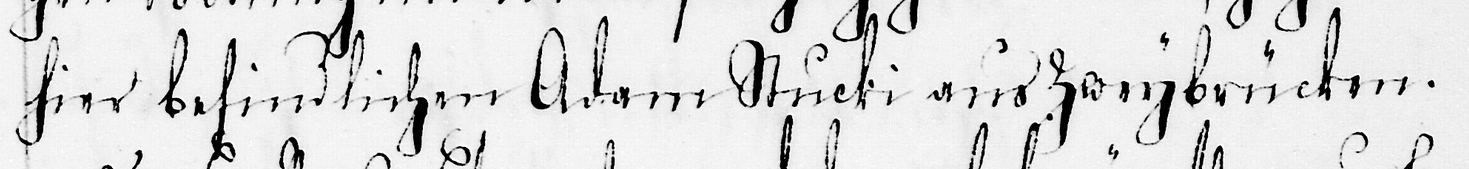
hier befindlichen Adam Stucki aus Zweybrücken.
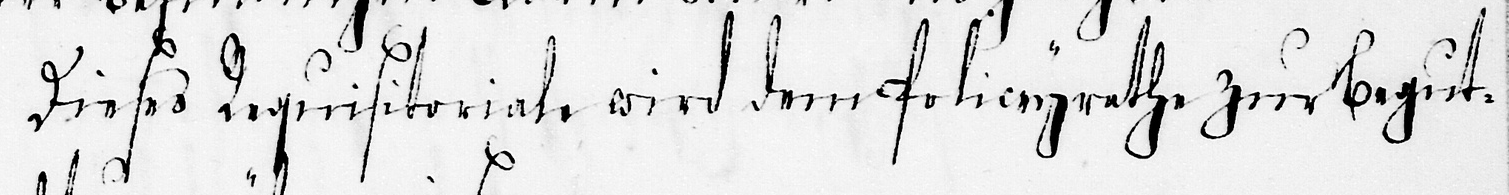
Dieses Requisitoriale wird dem Policeyrathe zur Begut¬
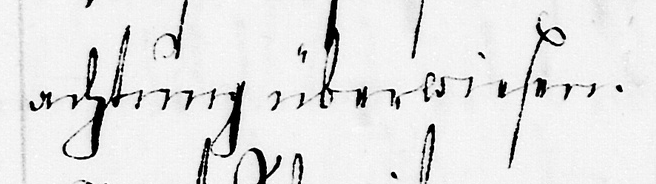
achtung überwiesen.
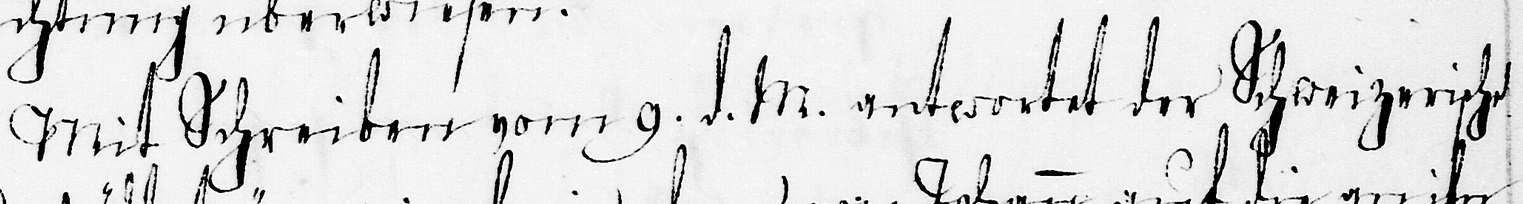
Mit Schreiben vom 9. d. M. antwortet der Schweizerische
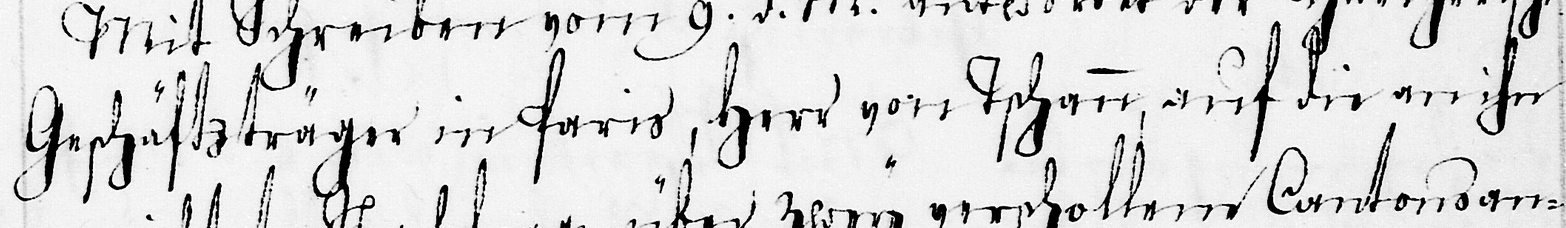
Geschäftsträger in Paris, Herr von Tschann, auf die an ihn
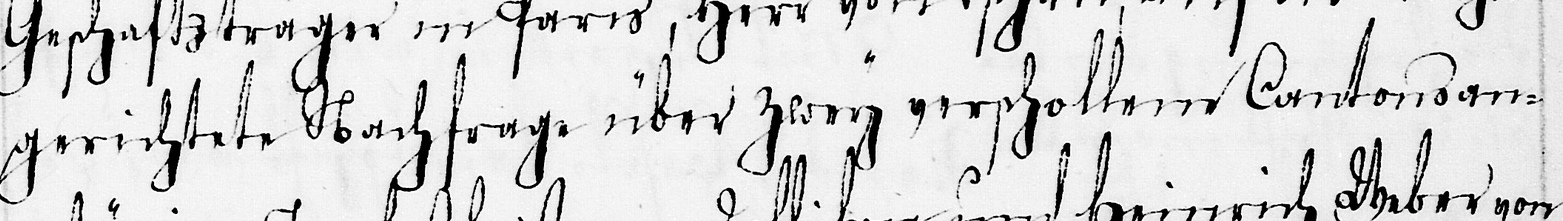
gerichtete Nachfrage über zwey verschollene Cantonsan¬
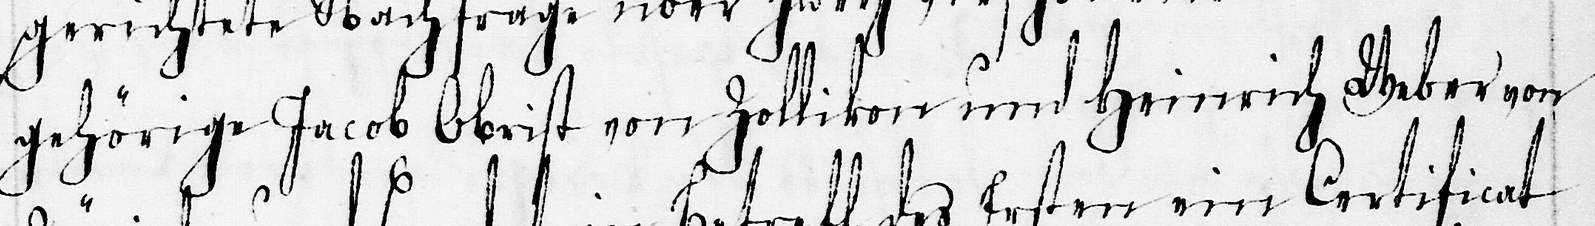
gehörige Jacob Obrist von Zollikon und Heinrich Weber von
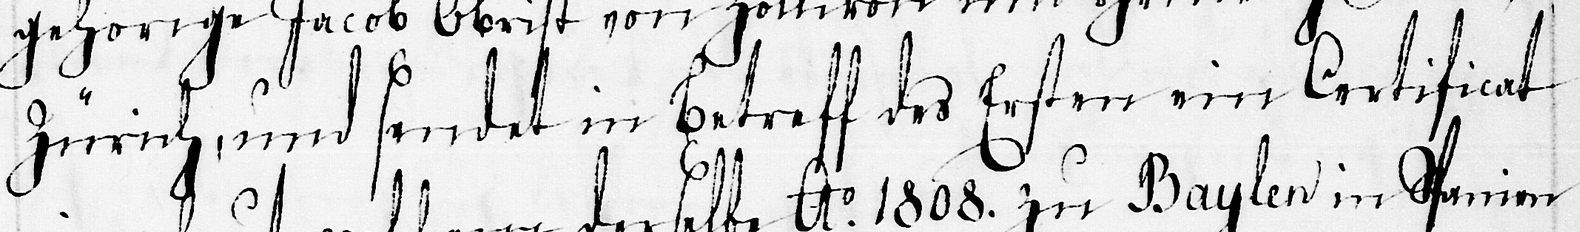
Zürich, und sendet in Betreff des Ersten ein Certificat
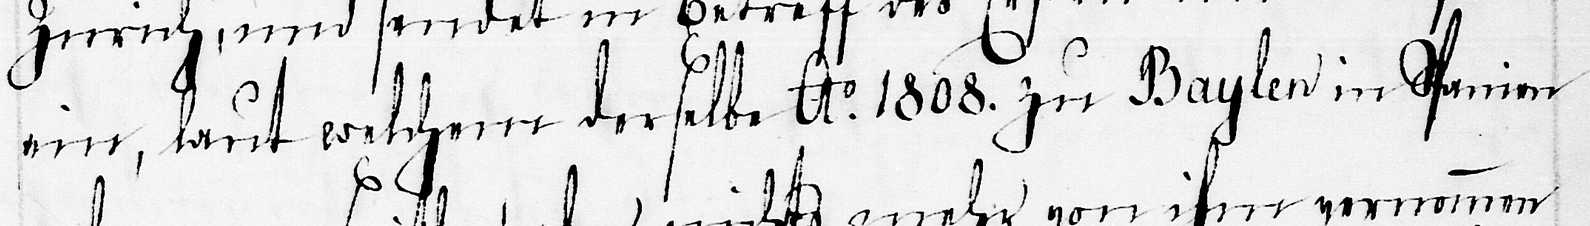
ein, laut welchem derselbe Ao. 1808. zu Baylen in Spanien
